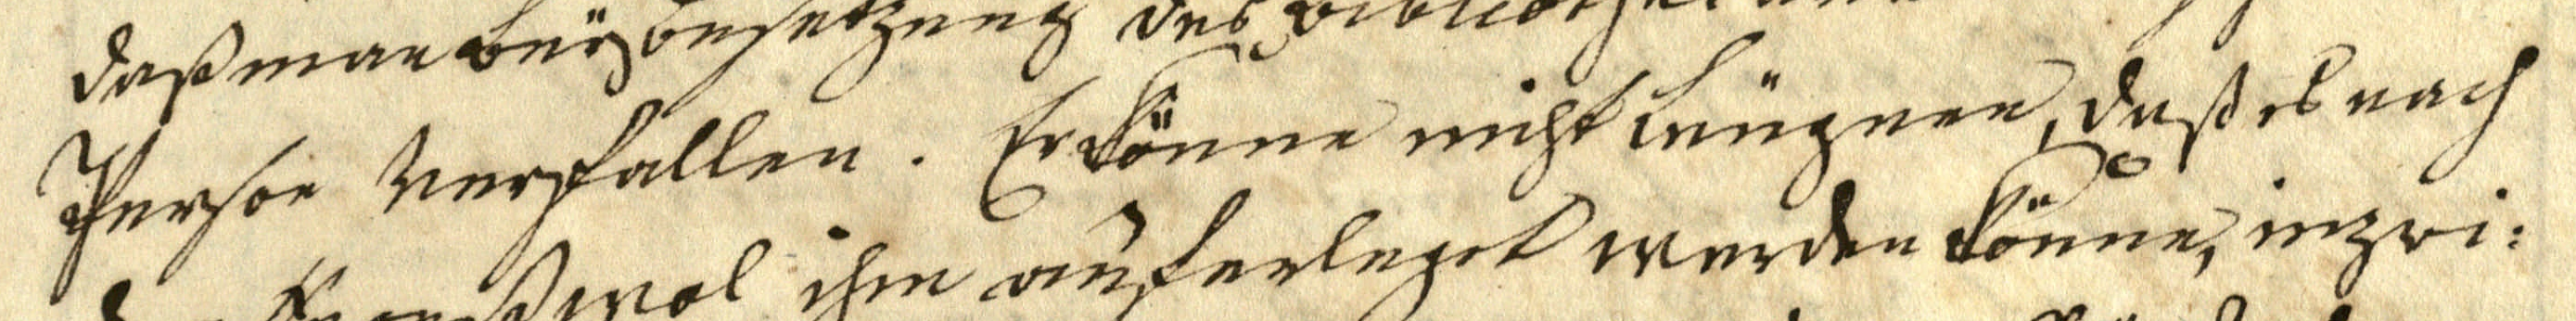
Person verfallen. Er könne nicht leugnen, daß es nach
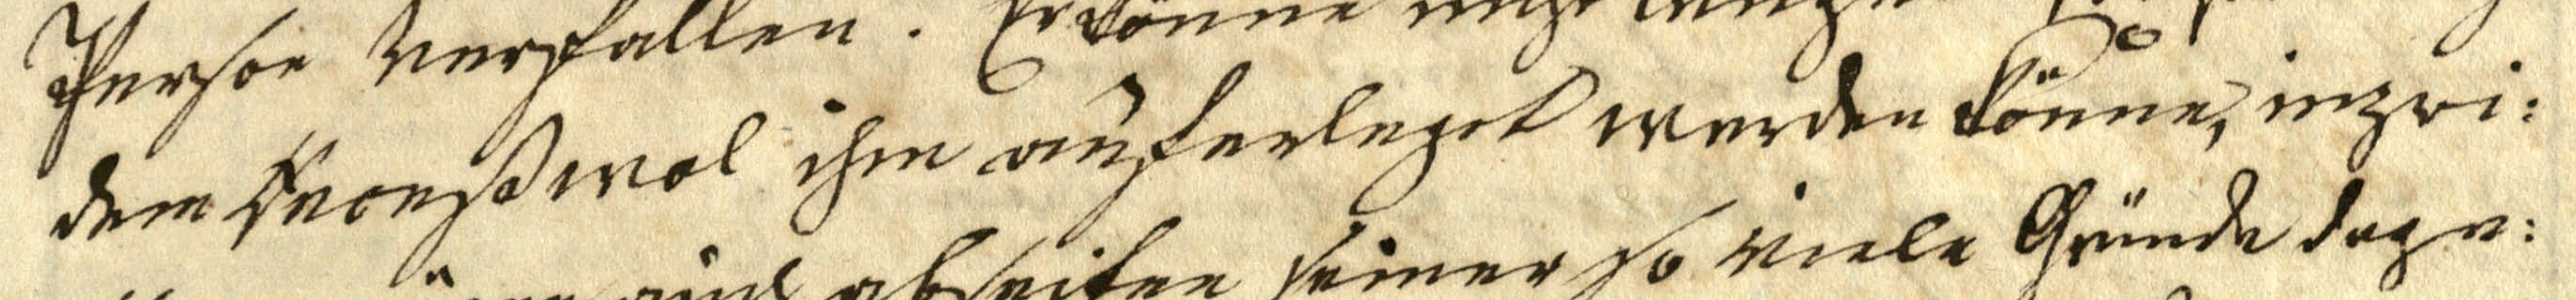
dem Receß wol ihm auferleget werden könne, inzwi¬
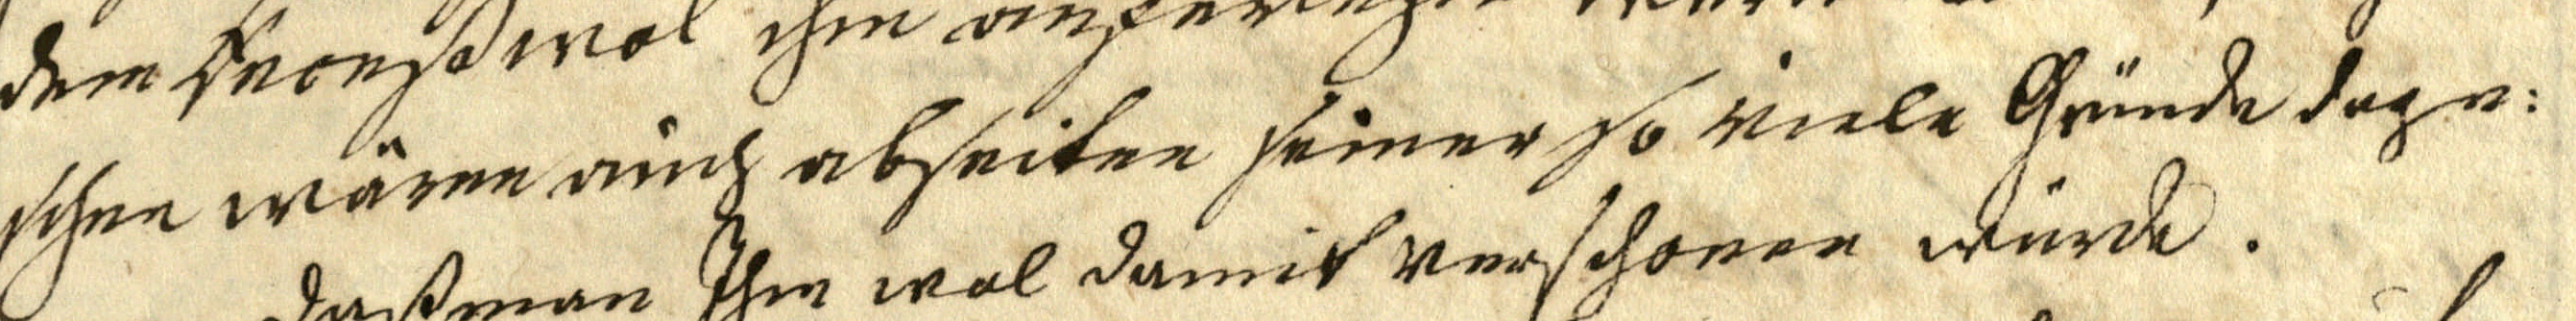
schen wären auch abseiten seiner so viele Gründe dage¬
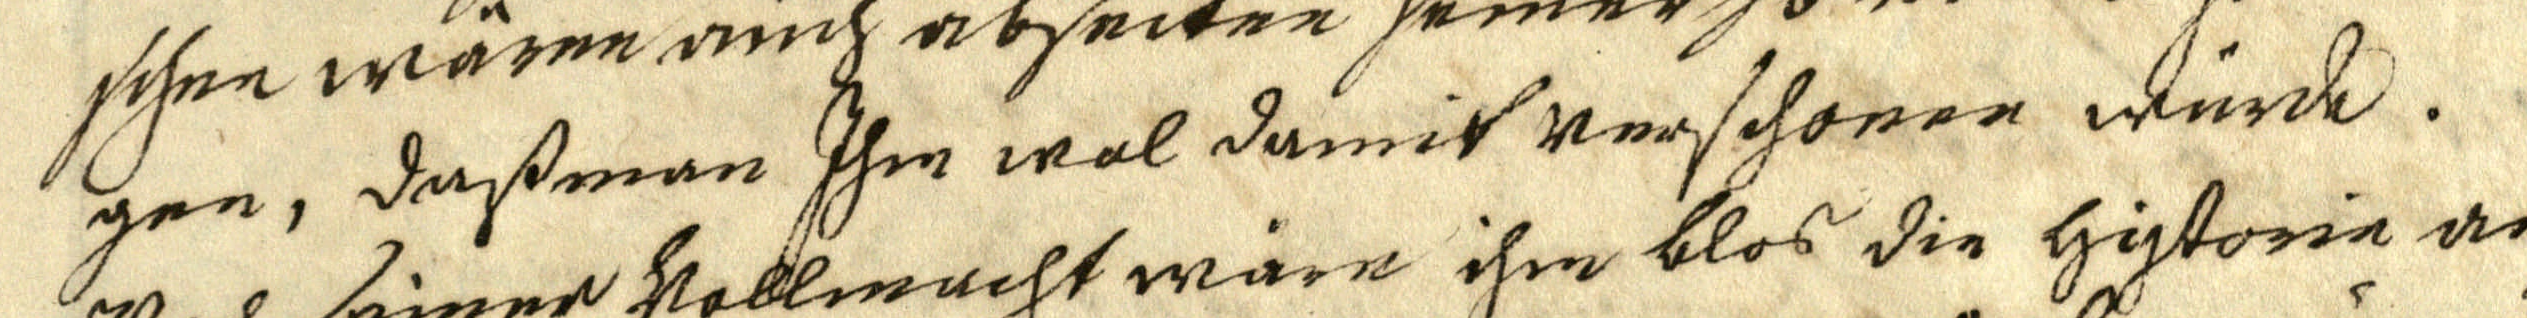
gen, daßman Ihm wol damit verschonen würde.
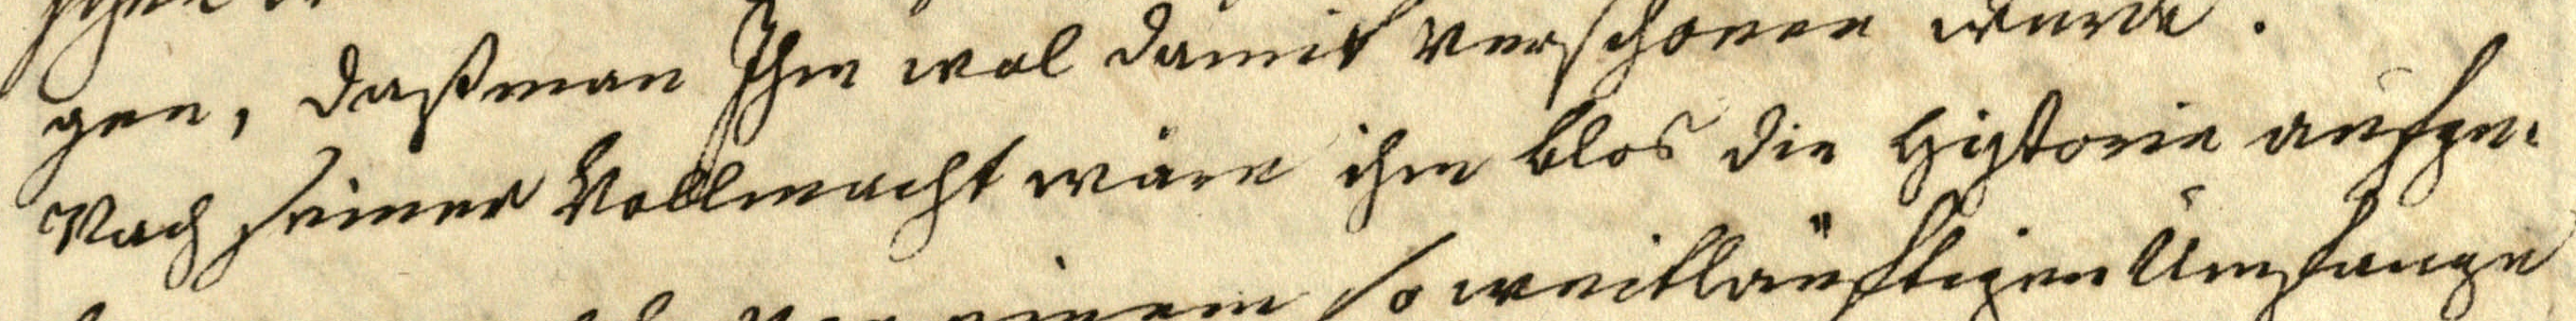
Nach seiner Vollmacht wäre ihm blos die Historie aufge¬
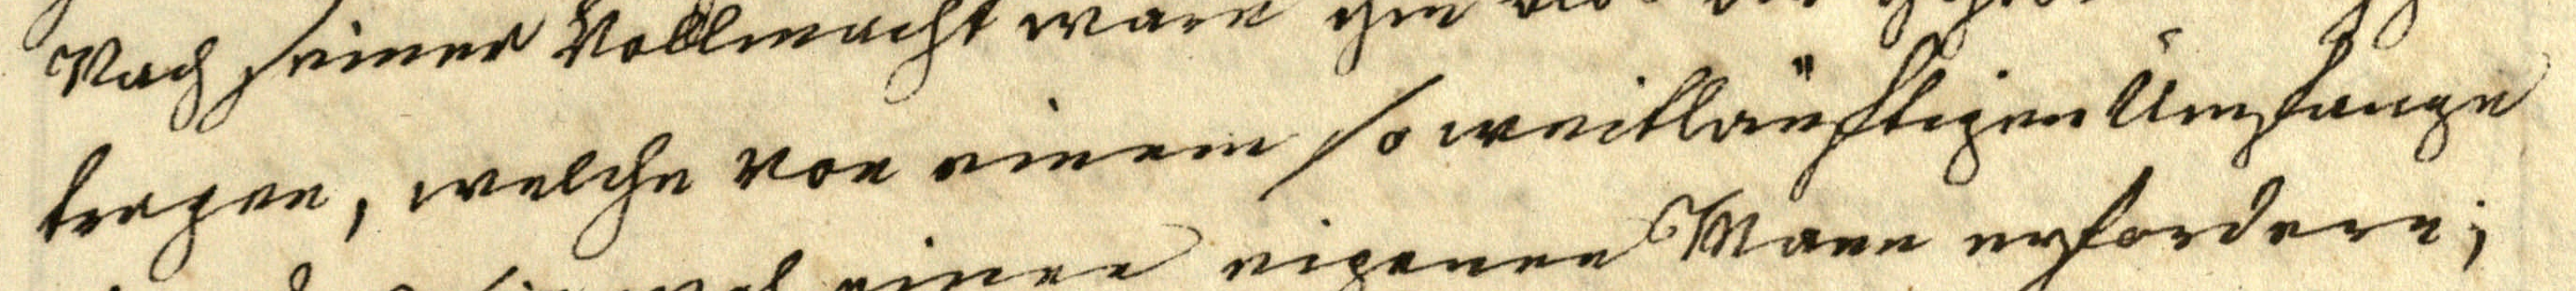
tragen, welche von einem so weitläuftigen Umfange
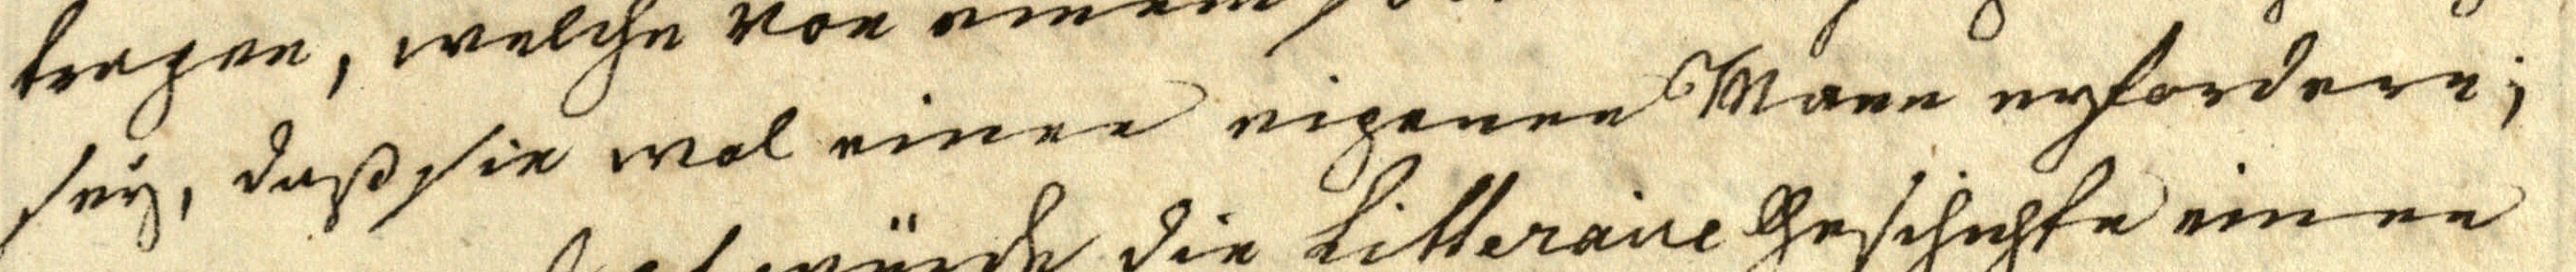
seÿ, daß sie wohl einen eigenen Mann erfordere,
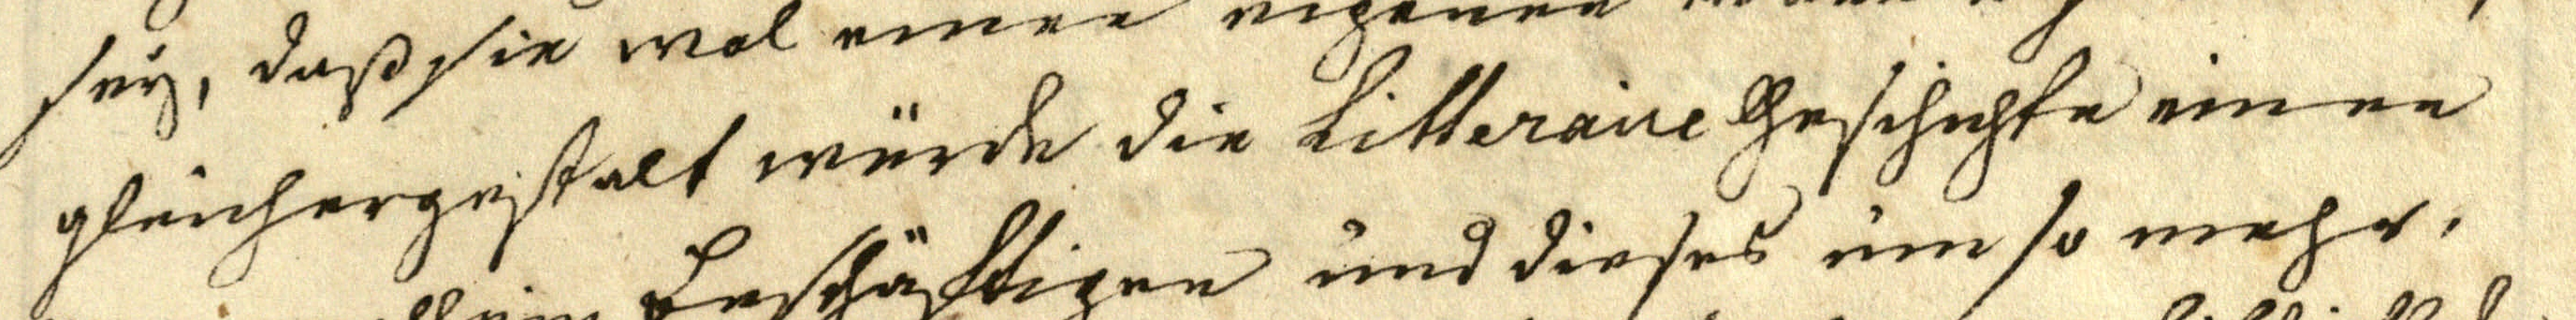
gleichergestalt würde die Litteraire Geschichte einen
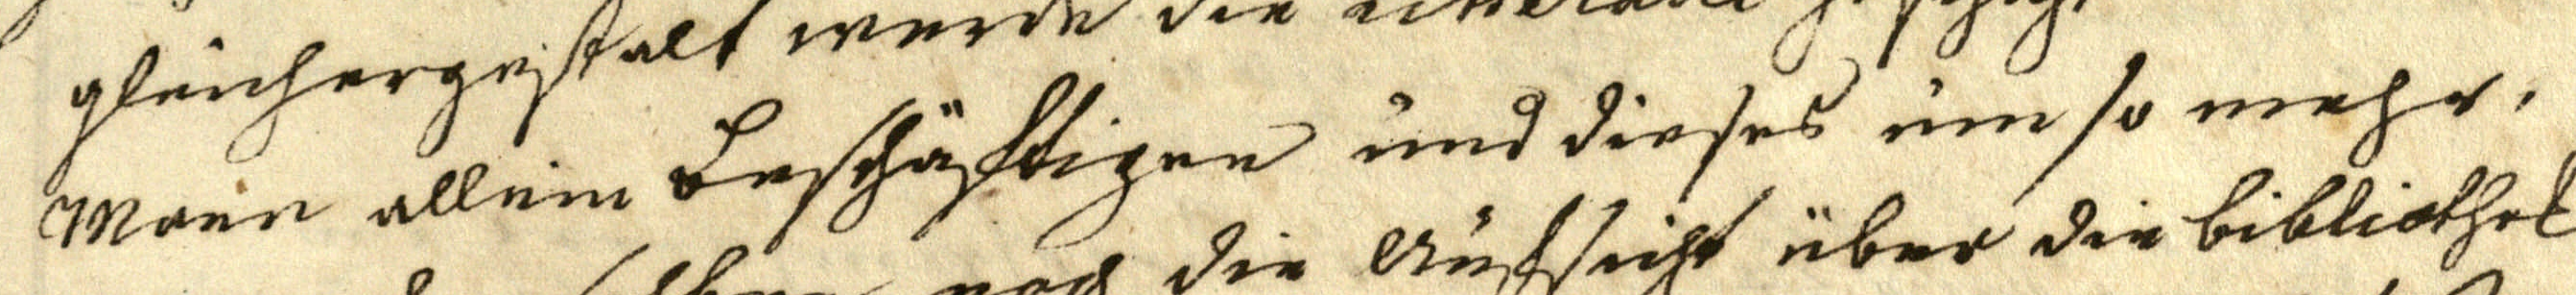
Mann allein beschäftigen und dieses ein so mehr,
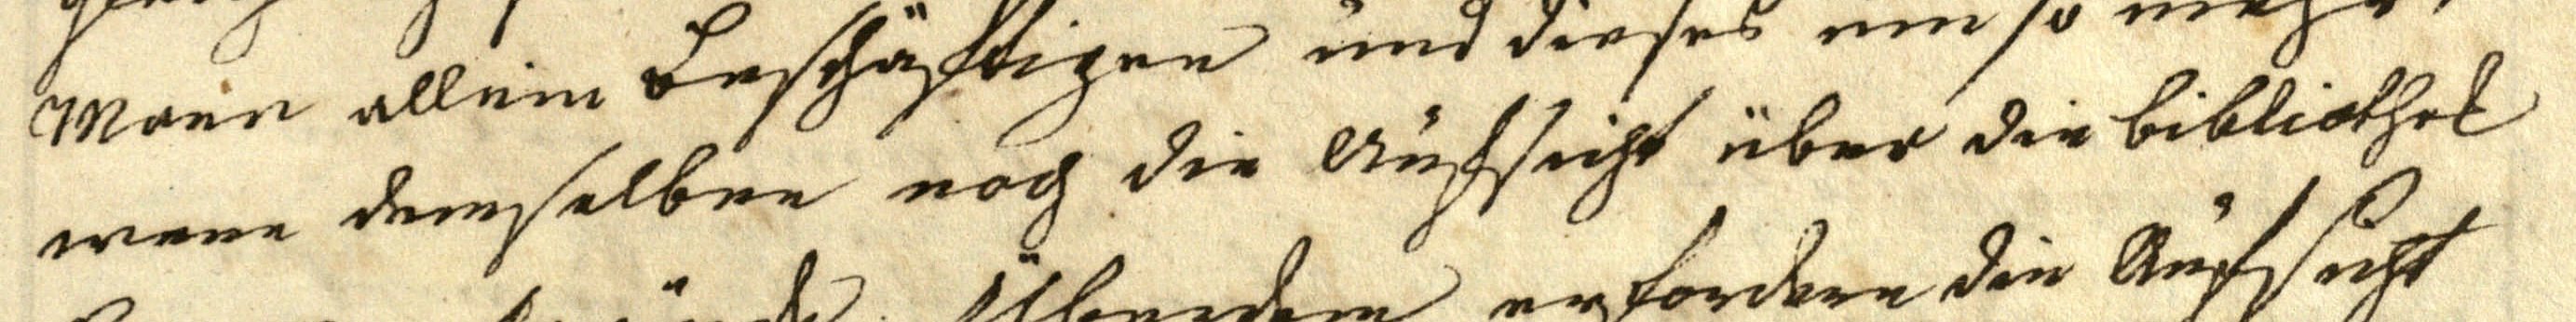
wenn demselben noch die Aufsicht über die Bibliothek
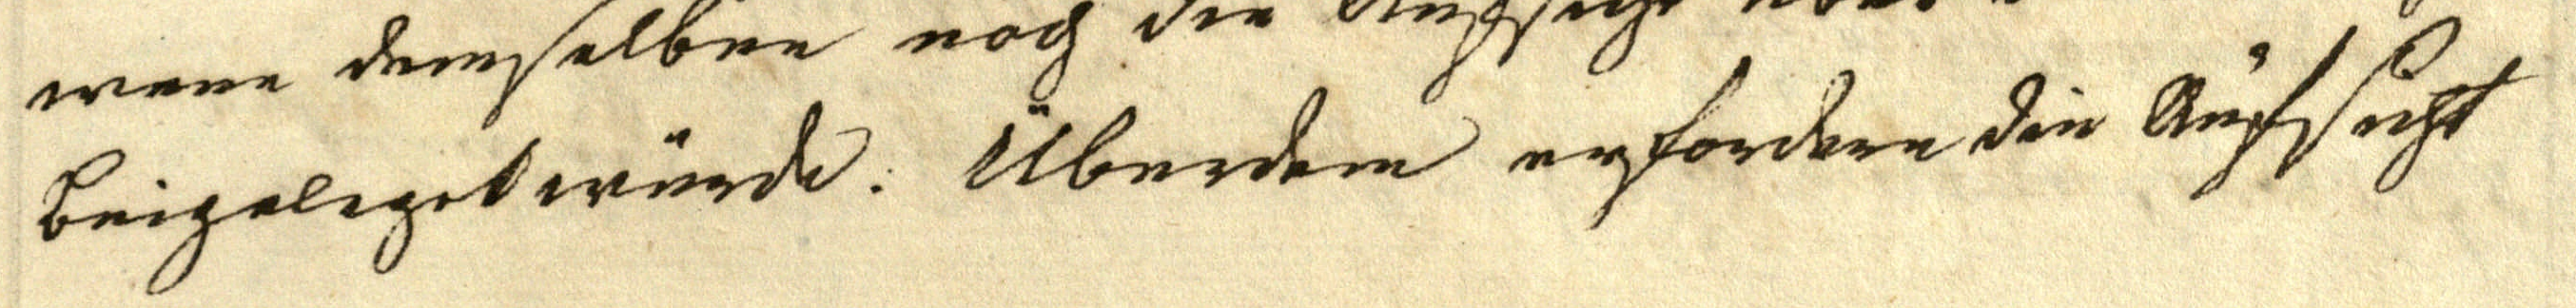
beigeleget würde. Überdem erfordern die Aufsicht
